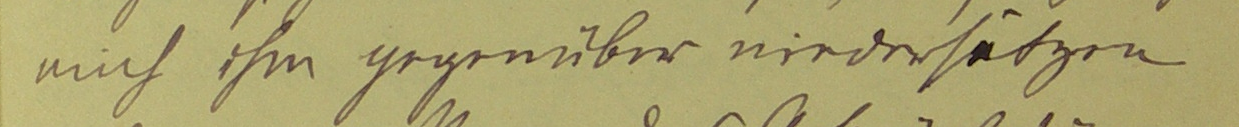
mich ihm gegenüber niedersitzen
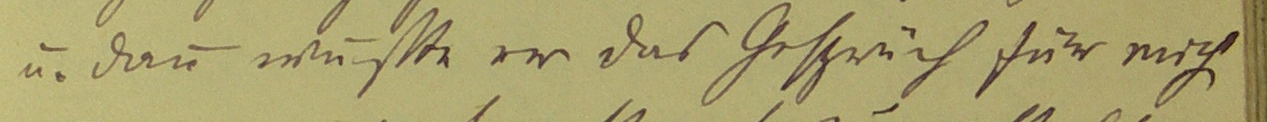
und dann wußte er das Gespräch für mich
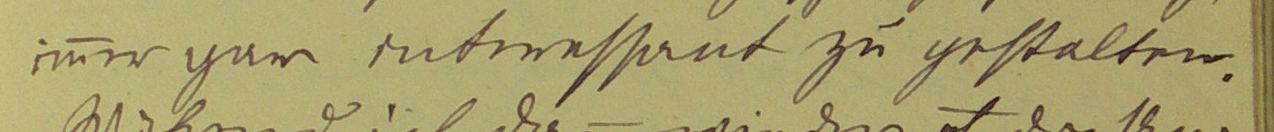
immer gar interessant zu gestalten.
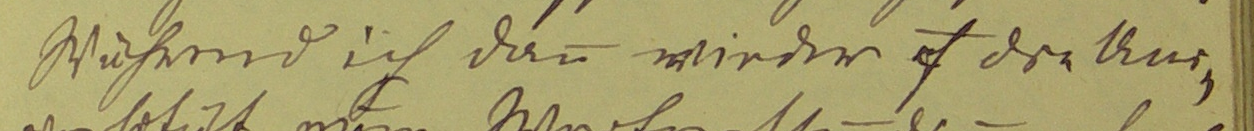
Während ich dann wieder auf die Uni¬
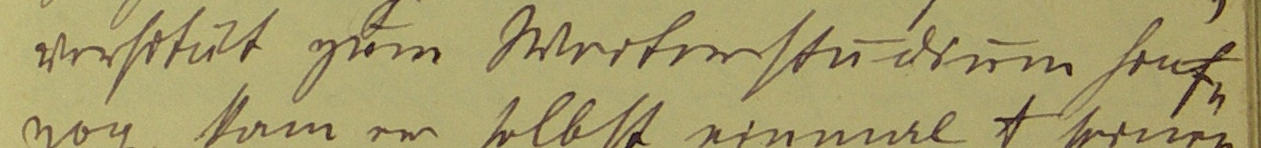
versität zum Weiterstudium fort¬
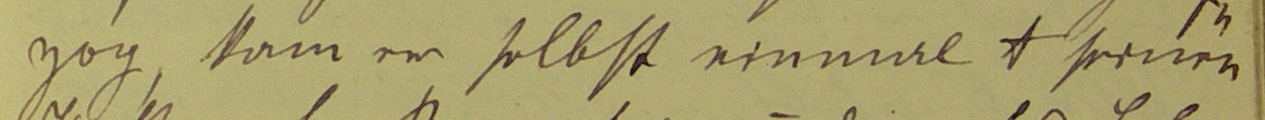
zog, kam er selbst einmal mit seinen
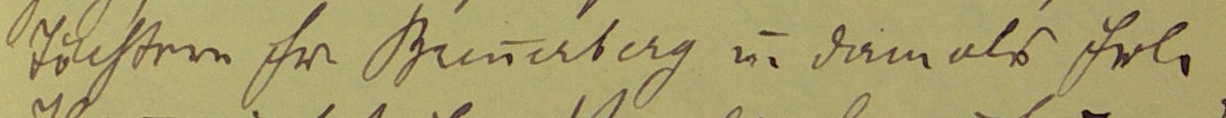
Töchtern Fr. Brennerberg und damals Frl.
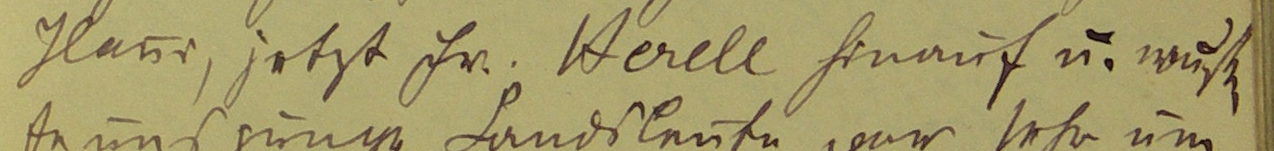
Hanni., jetzt Fr. Herell hinauf und wuß¬
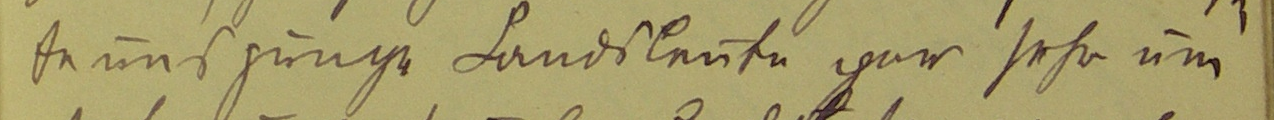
te uns junge Landsleute gar sehr um
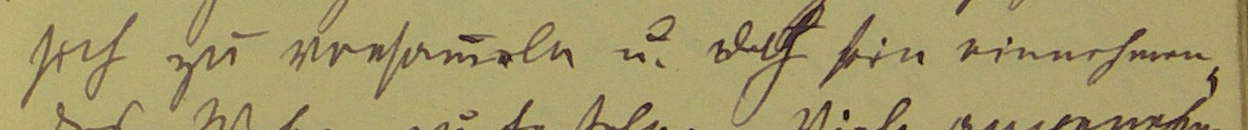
sich zu versammeln und durch sein einnehmen¬
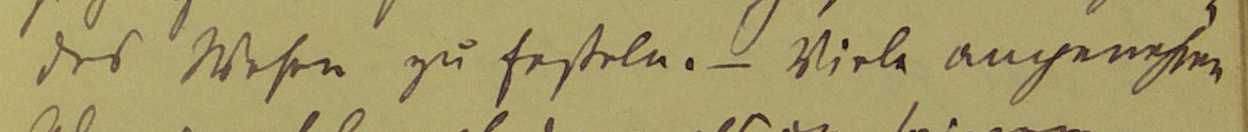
des Wesen zu feßeln. Viele angenehme
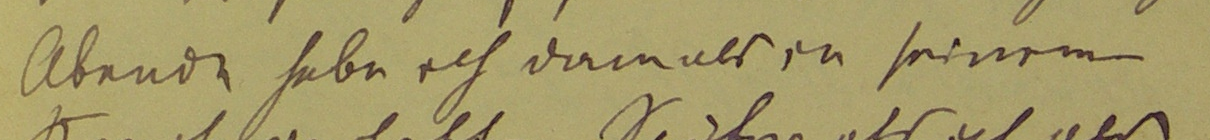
Abende habe ich damals in seinem
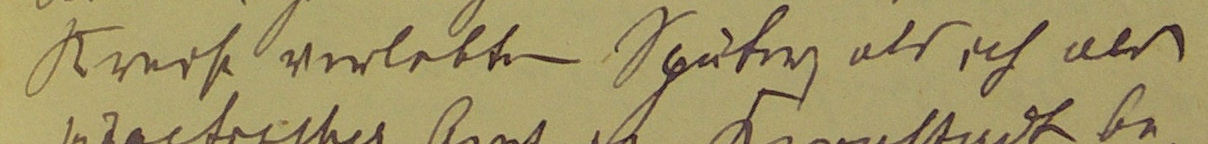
Kreis verlebt. Später als ich als
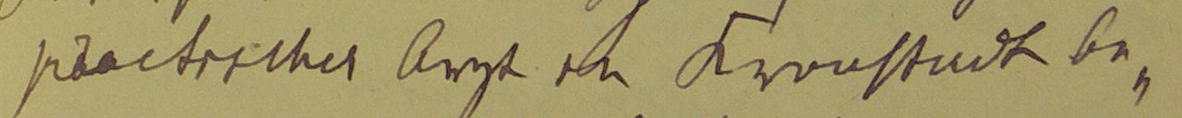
praktischer Arzt in Kronstadt be
